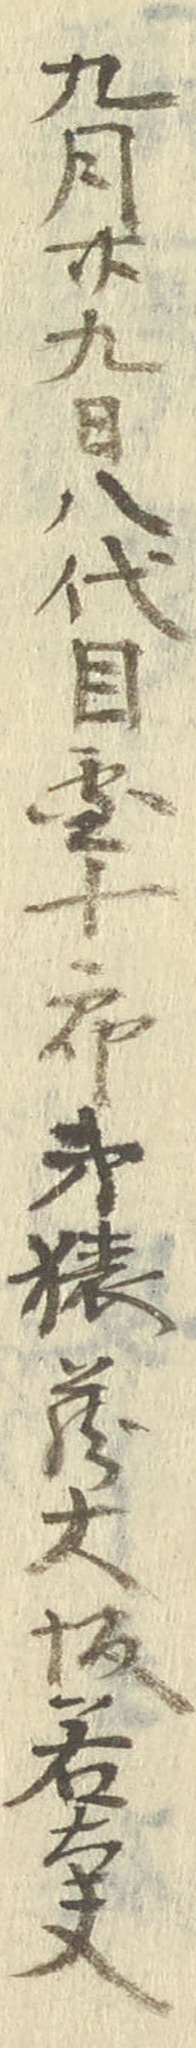九月廿九日八代目團十郎弟猿蔵大坂若太夫
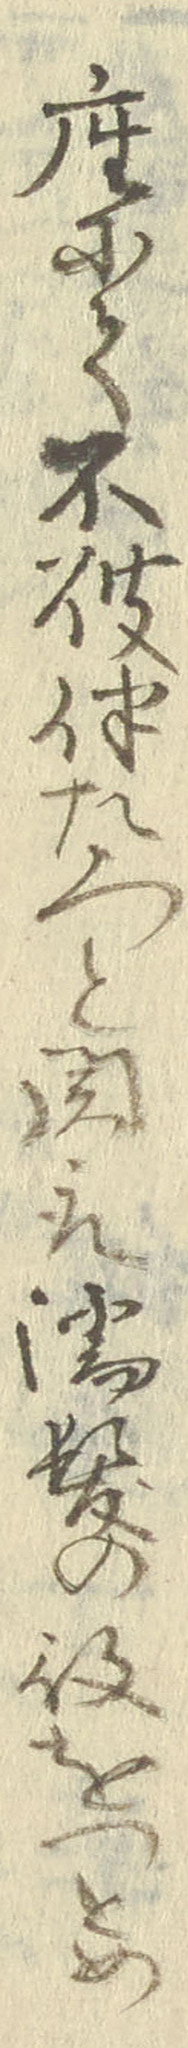座にて不破伴左衛門と関取濡髪の役をつとめ
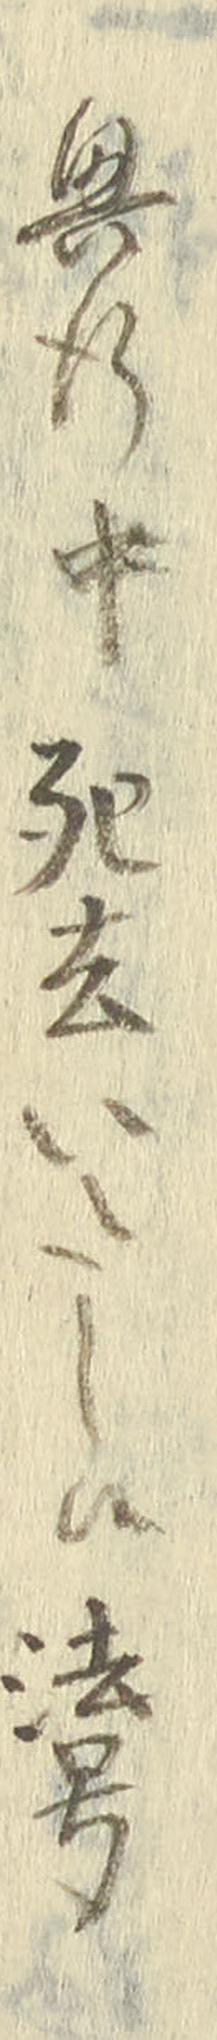興行中死去いたし候法号
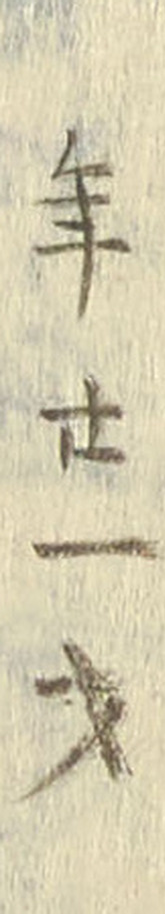年廿一才
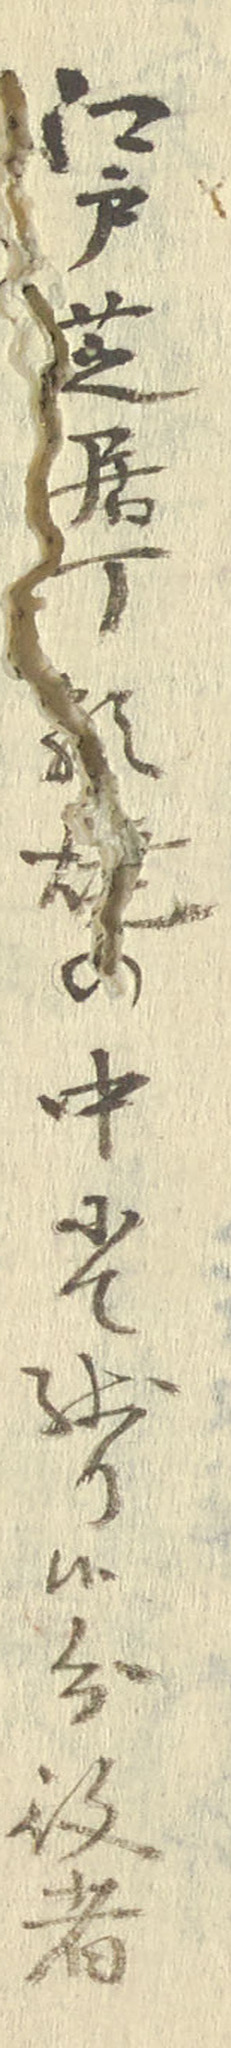江戸芝居丁類焼の中にて残り候分役者
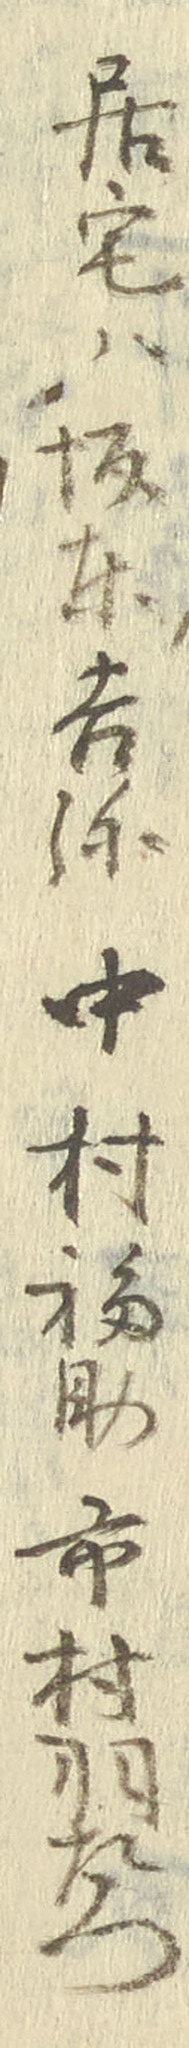居宅ハ坂本吉弥中村福助市村羽左衛門
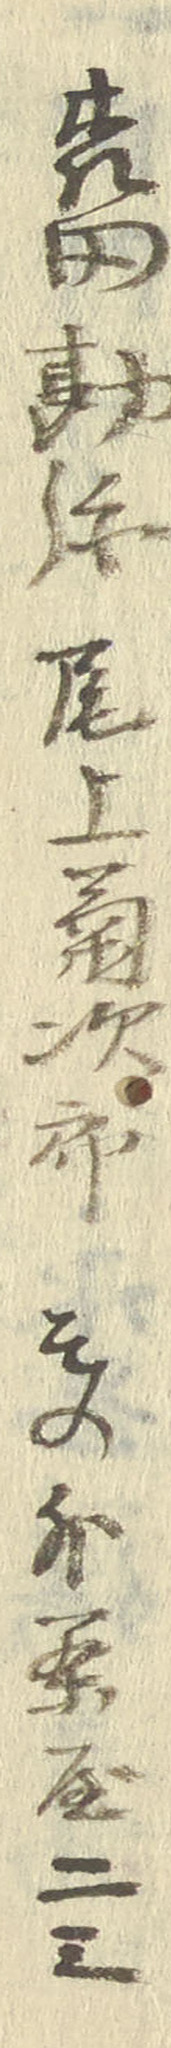森田勘弥尾上菊次郎その外茶屋二三
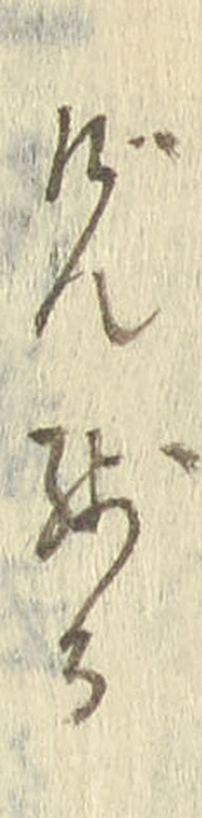げん残る
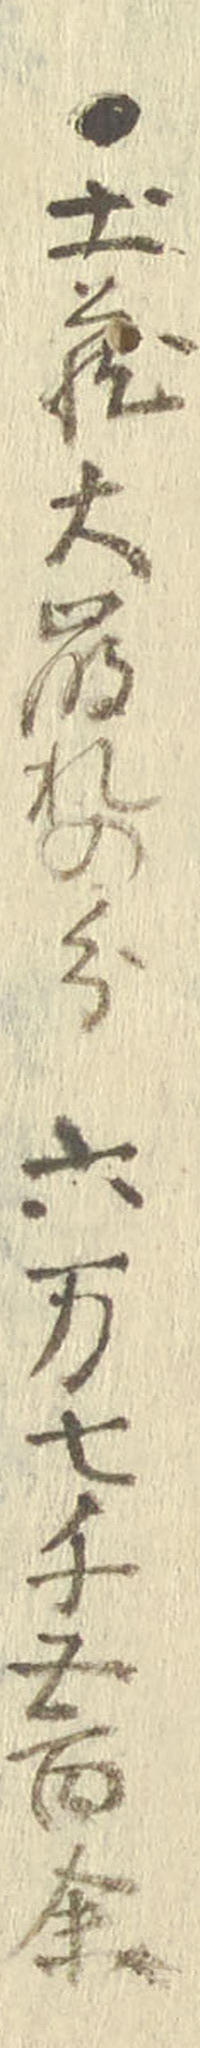●土蔵大崩れの分六万七千五百余
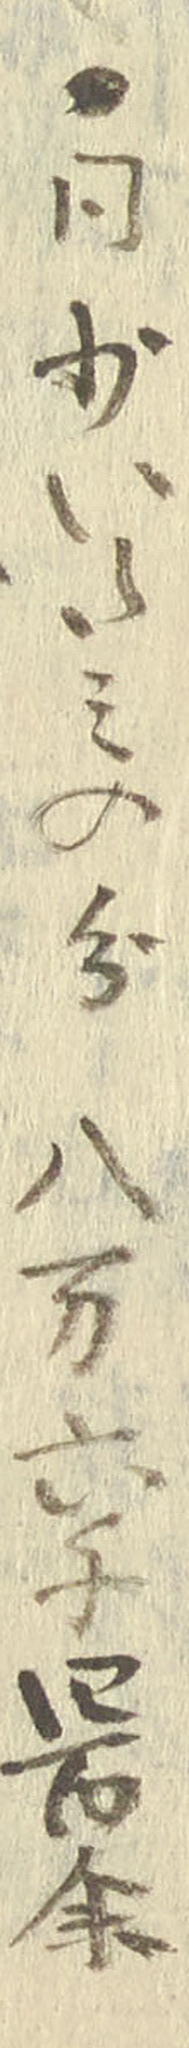●同少いたミの分八万六千四百余
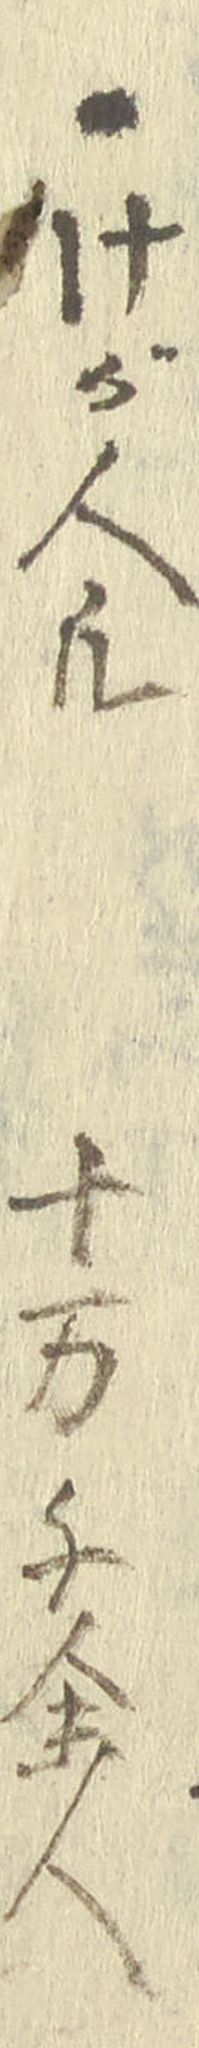●けが人凢十万千余人
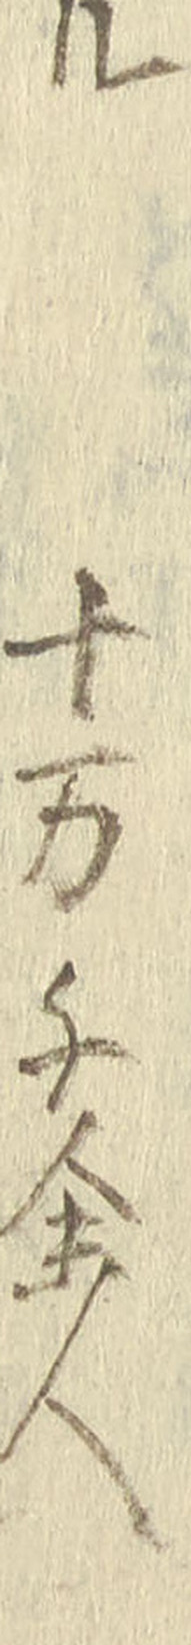万弐千余人
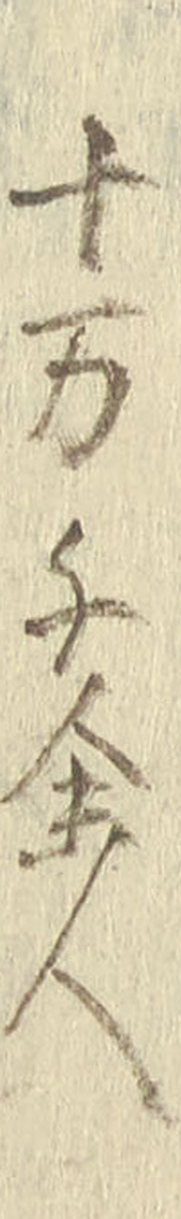万弐千余人
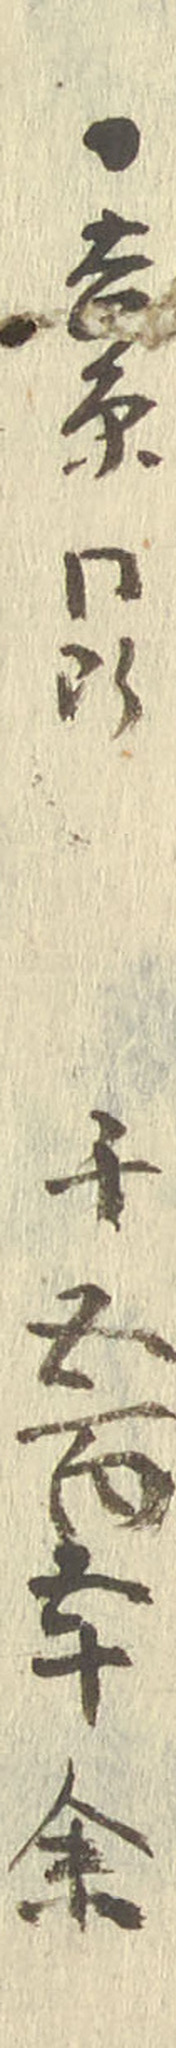●吉原同断千五百五十余
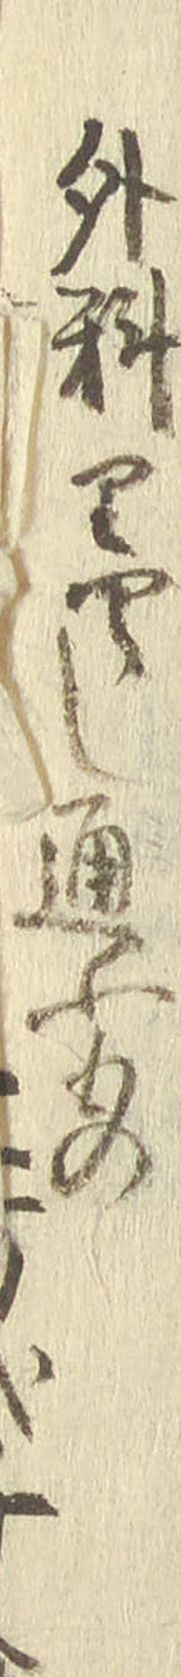外科りやうし通ふもの
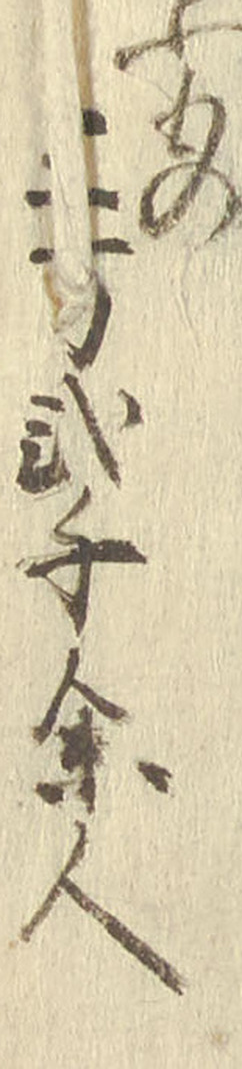万弐千余人
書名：御府内御屋敷方市中共地震類焼場所明細書之冩兼街道筋近郷聞書
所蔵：東京大学総合図書館 General Library in the University of Tokyo, JAPAN
